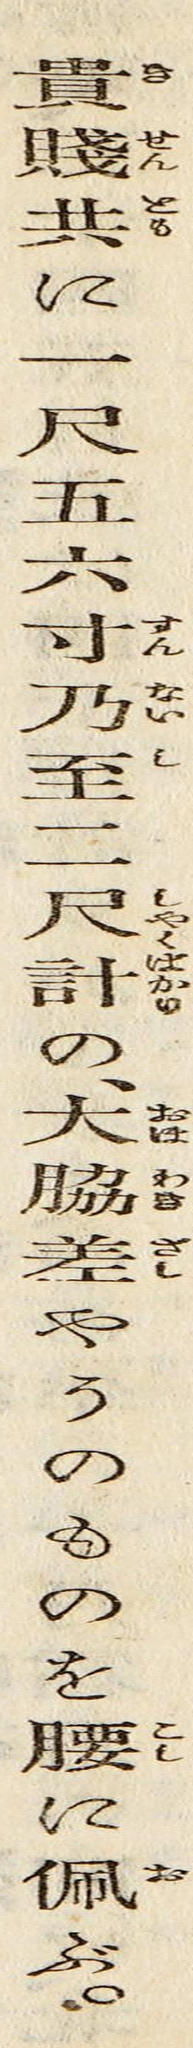貴賤共に一尺五六寸乃至二尺計の、大脇差やうのものを腰に佩ぶ。
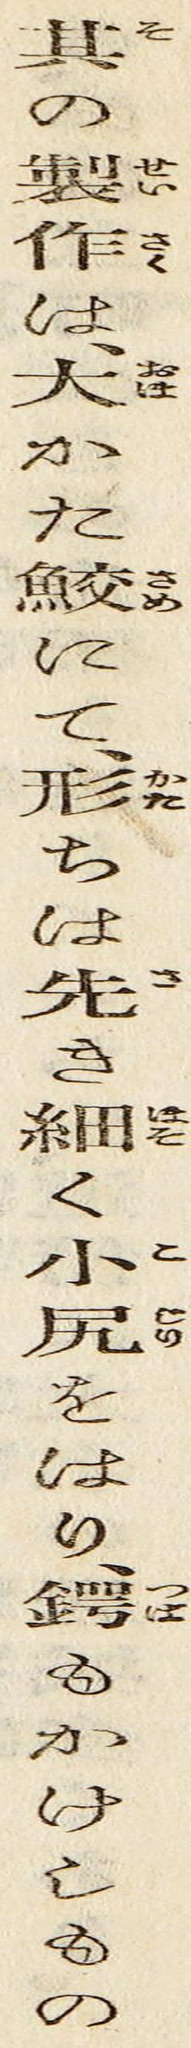其の製作は、大かた鮫にて、形ちは先き細く小尻をはり、鍔もかけしもの
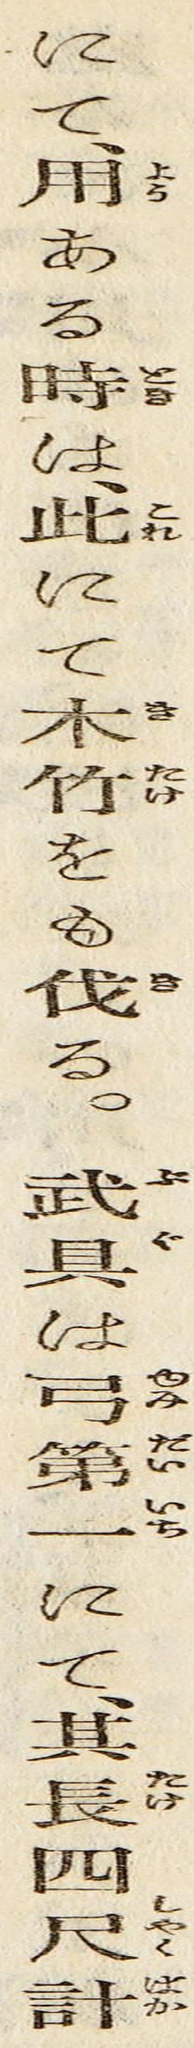にて、用ある時は、此にて木竹をも伐る。武具は弓第一にて、其長四尺計
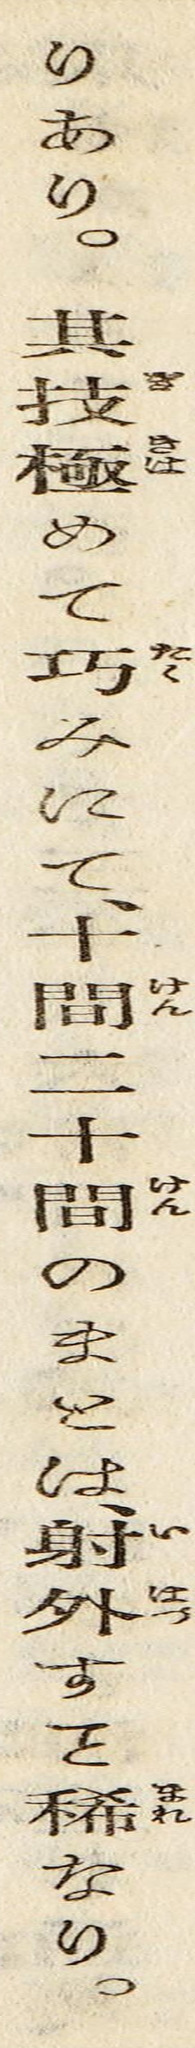りあり。其技極めて巧みにて、十間二十間のまとは、射外すこと稀なり。
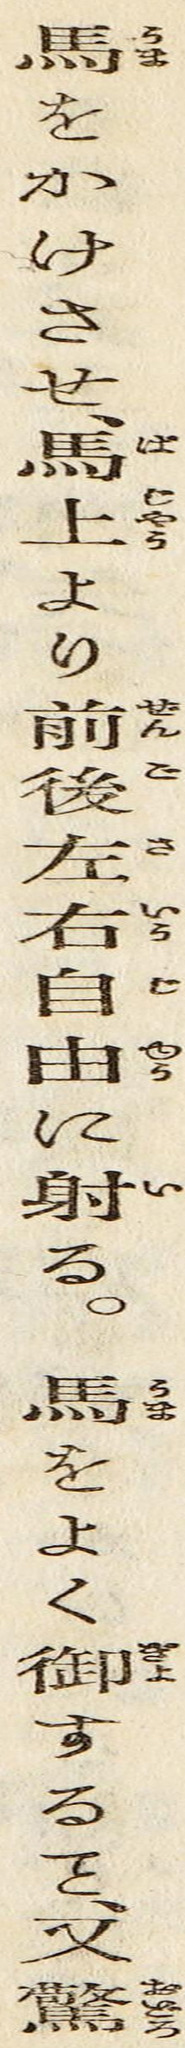馬をかけさせ、馬上より前後左右自由に射る。馬をよく御すること、又驚
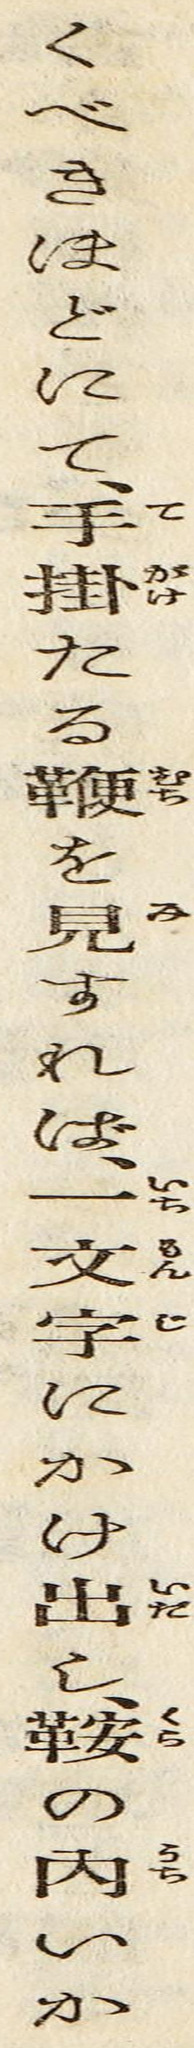くべきほどにて、手掛たる鞭を見すれば、一文字にかけ出し、鞍の内いか
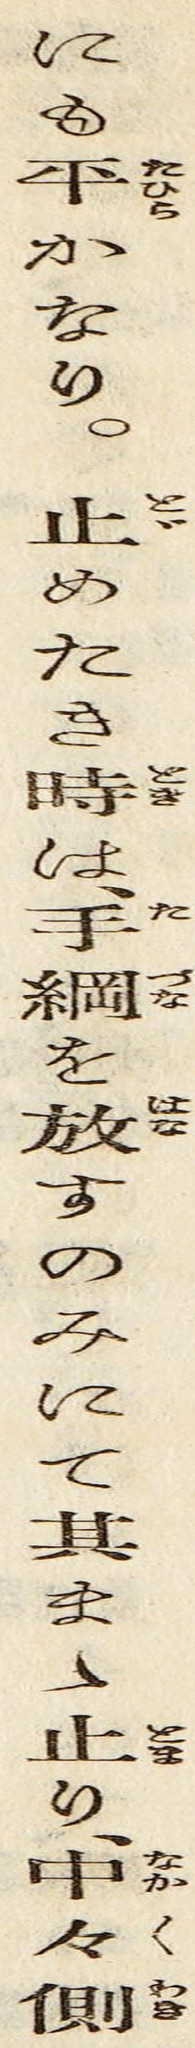にも平かなり。止めたき時は、手綱を放すのみにて其まゝ止り、中々側
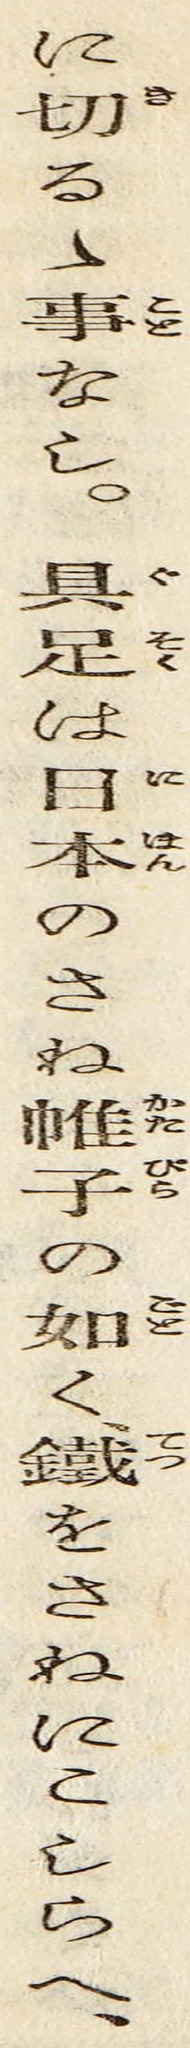に切るゝ事なし。具足は日本のさね帷子の如く、鉄をさねにこしらへ、
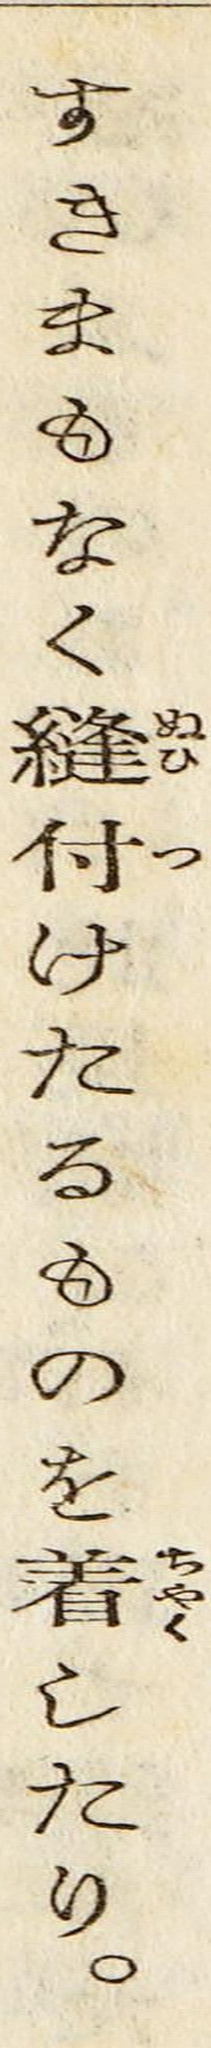すきまもなく縫付けたるものを着したり。
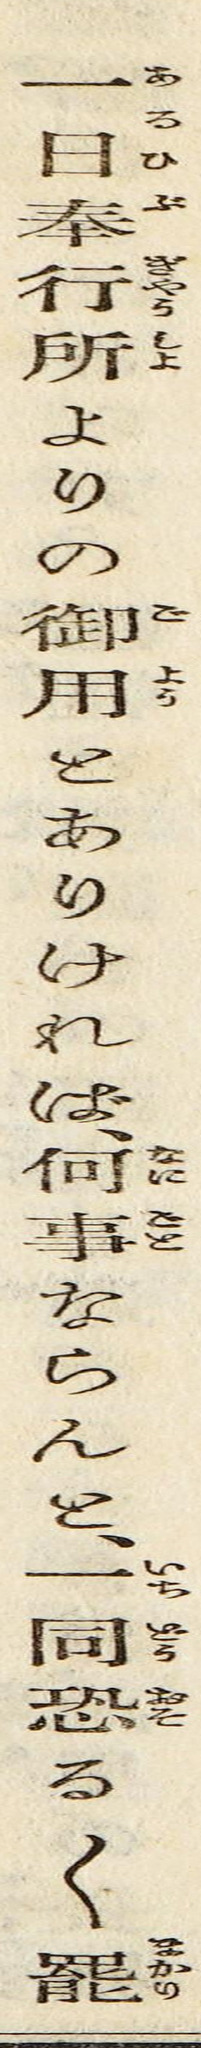一日奉行所よりの御用とありければ、何事ならんと、一同恐る〳〵罷
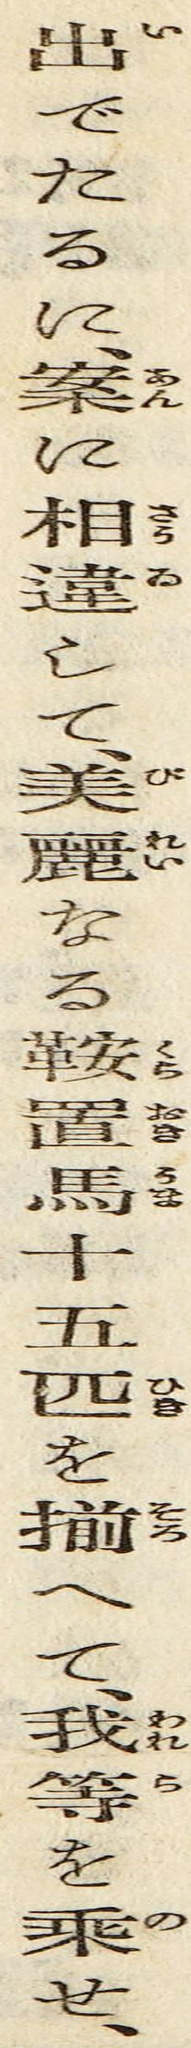出でたるに、案に相違して、美麗なる鞍置馬十五匹を揃へて、我等を乗せ、
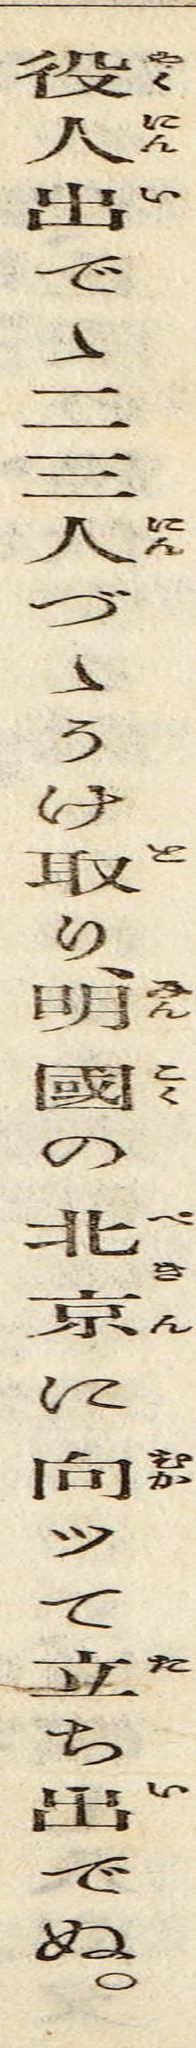役人出でゝ二三人づゝうけ取り、明国の北京に向ツて立ち出でぬ。

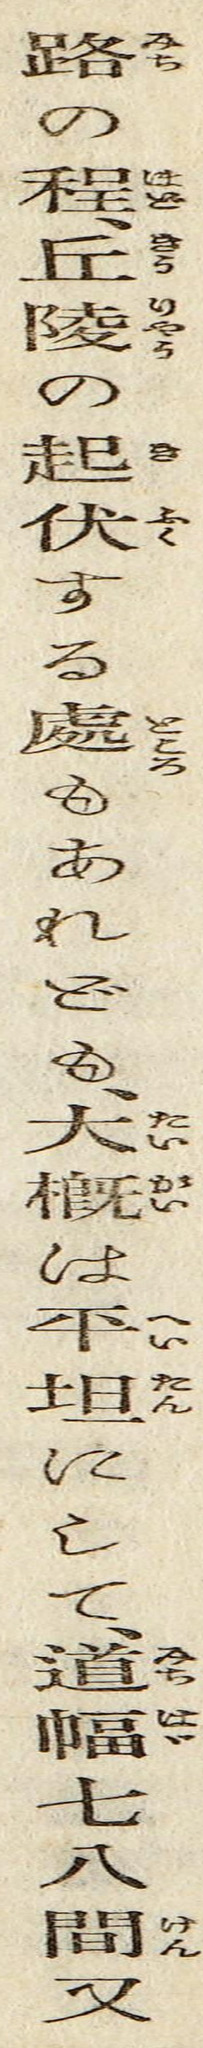路の程、丘陵の起伏する処もあれども、大概は平坦にして、道幅七八間又
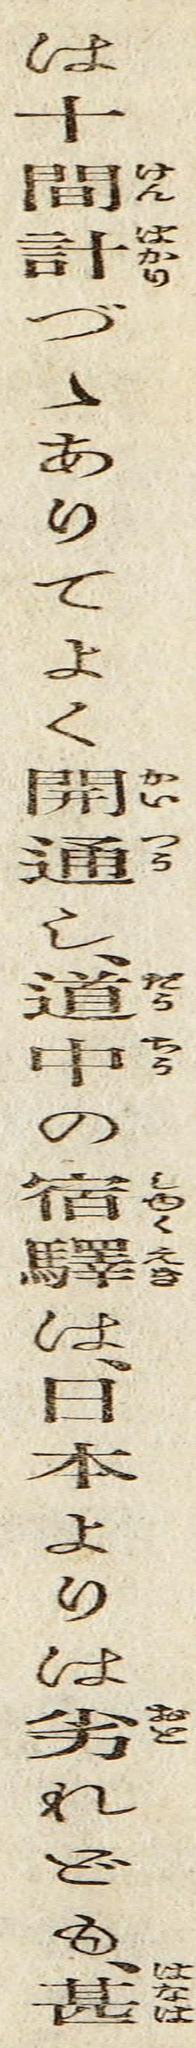は十間計づゝありてよく開通し、道中の宿駅は、日本よりは劣れども、甚
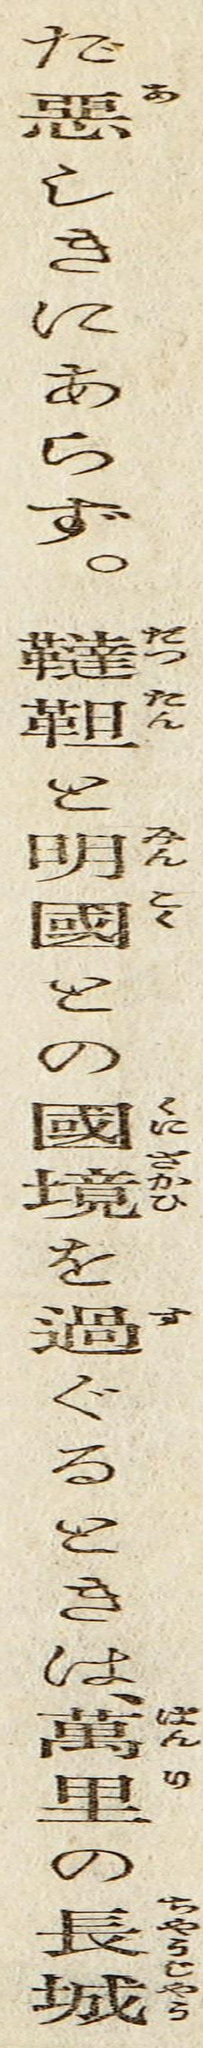だ悪しきにあらず。韃靼と明国との国境を過ぐるときは、万里の長城
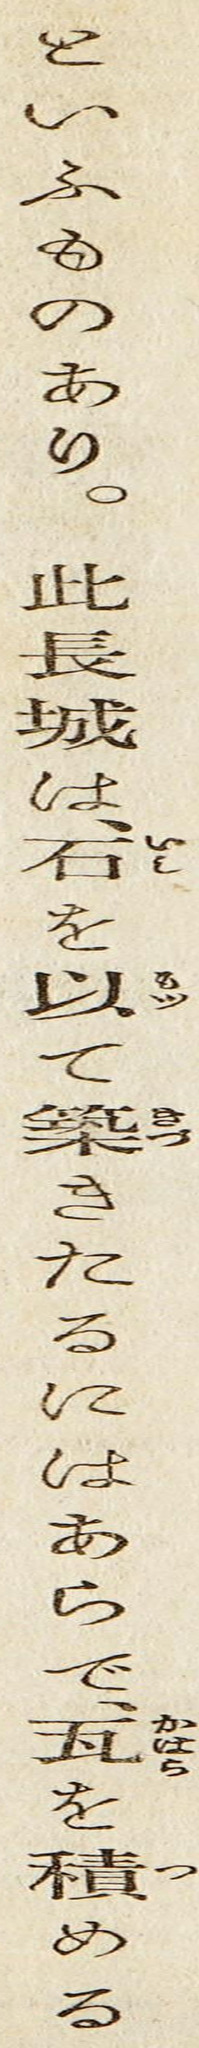といふものあり。此長城は、石を以て築きたるにはあらで、瓦を積める
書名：日本漂流譚
